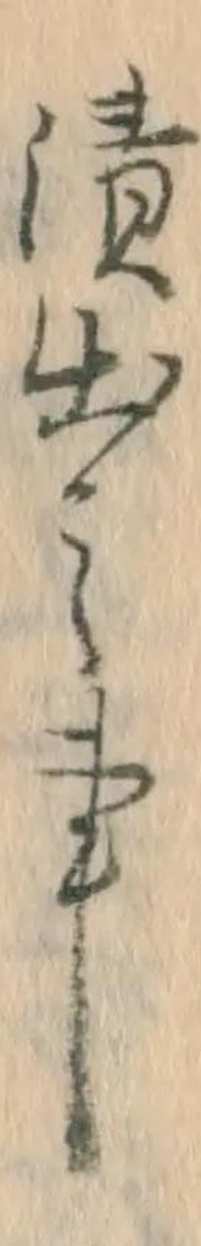漬出之事
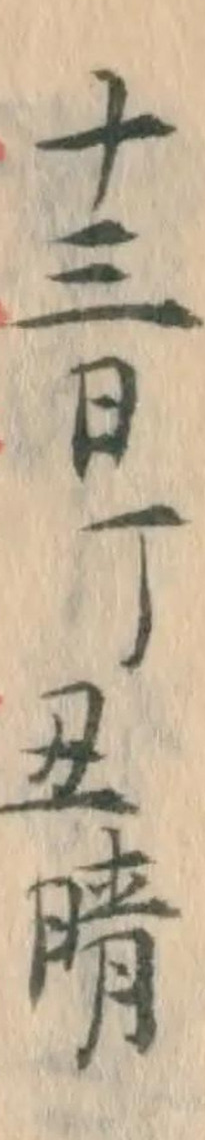十三日丁丑晴
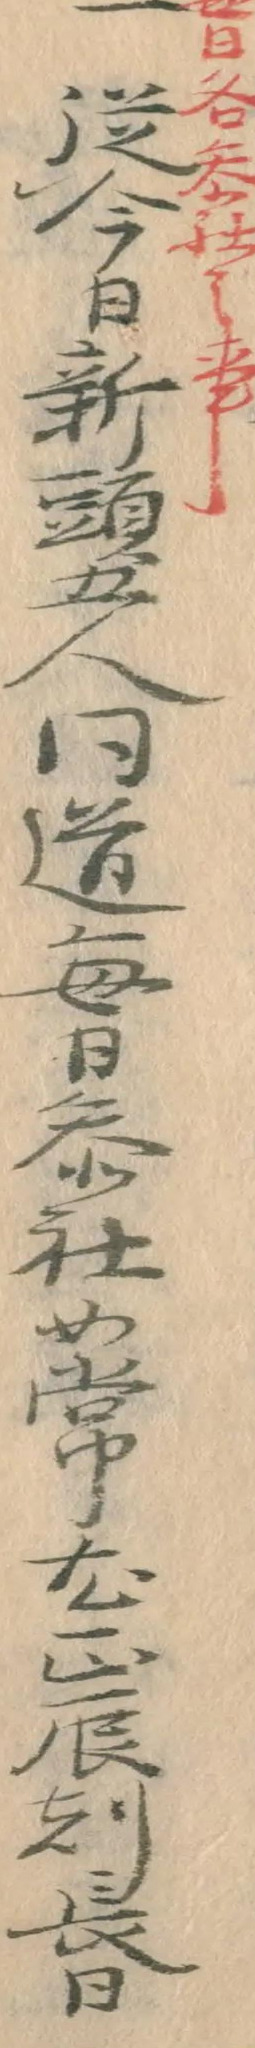一従今日新頭五人同道毎日参社如常尤正辰刻長日
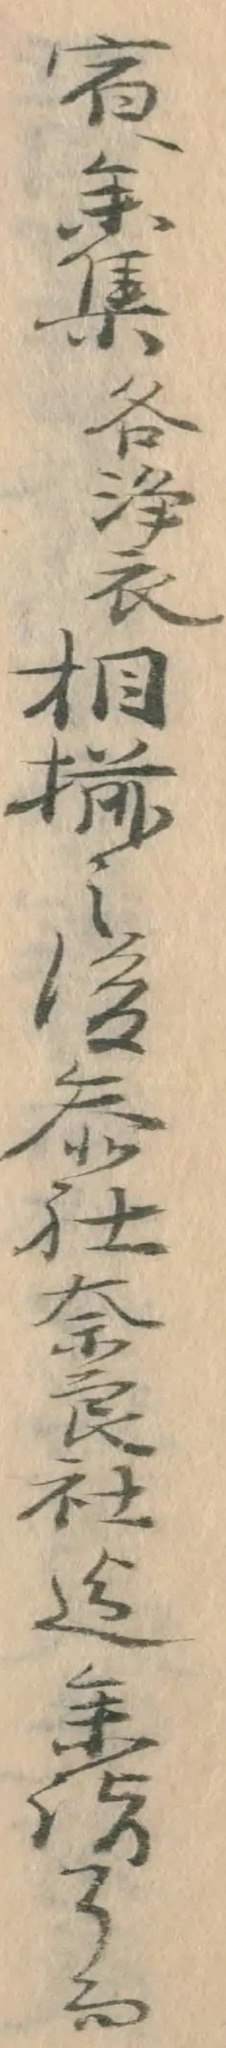宿ヘ参集各浄衣相揃之後参社奈良社迄参詣了而

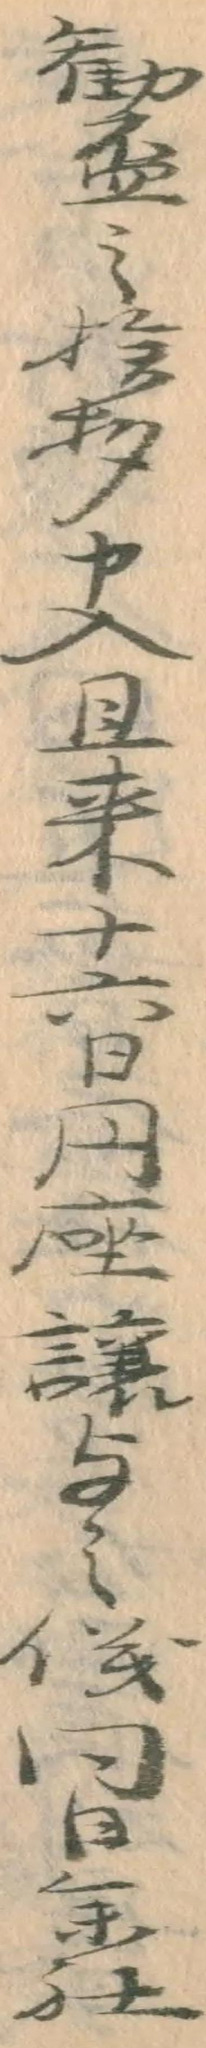勧盃之挨拶申入且来十六日円座譲与之儀同日参社
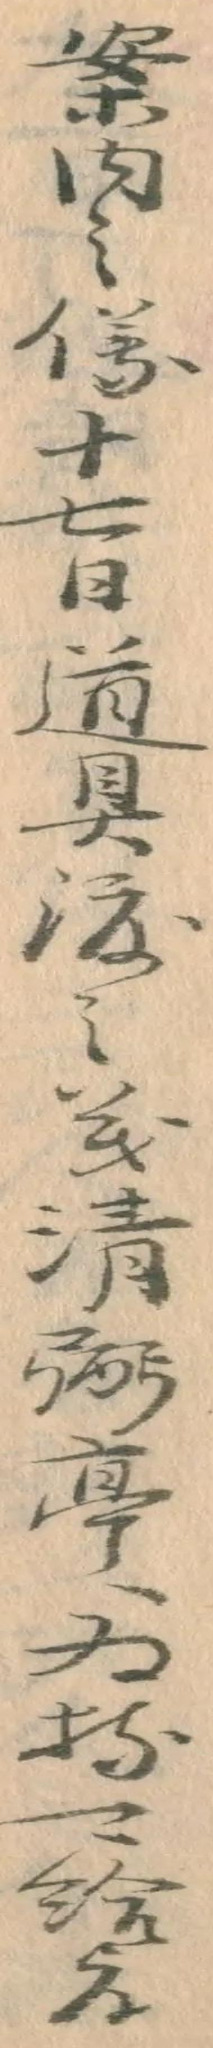案内之儀十七日道具渡之義清弼亭へ為持可給旨
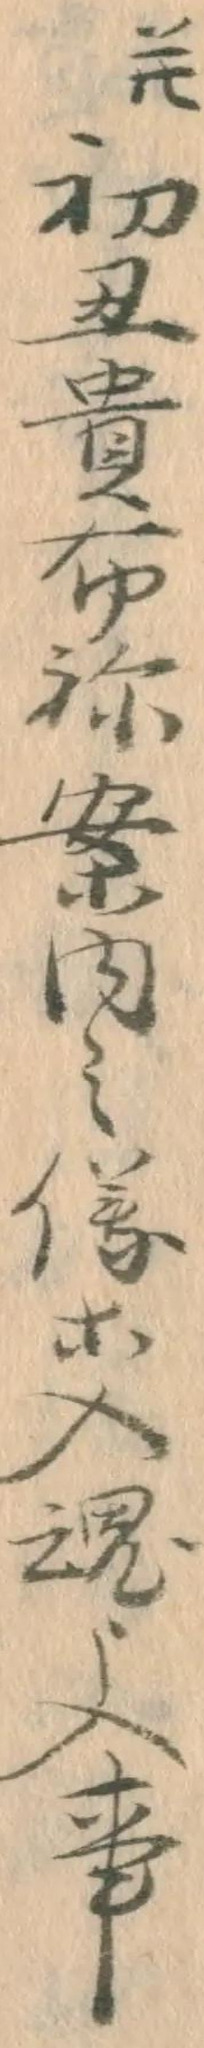并初丑貴布称案内之儀等入魂申入事
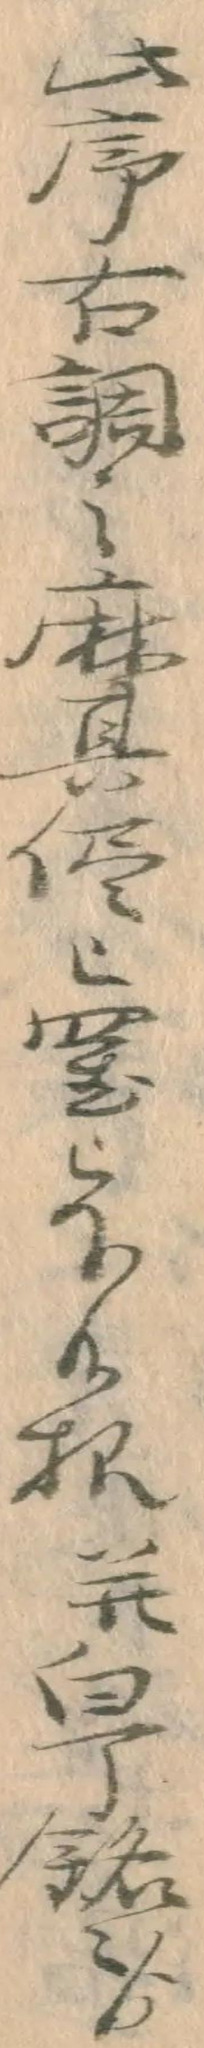此序右調之麻其侭被置被下候様并白丁銘々ゟ
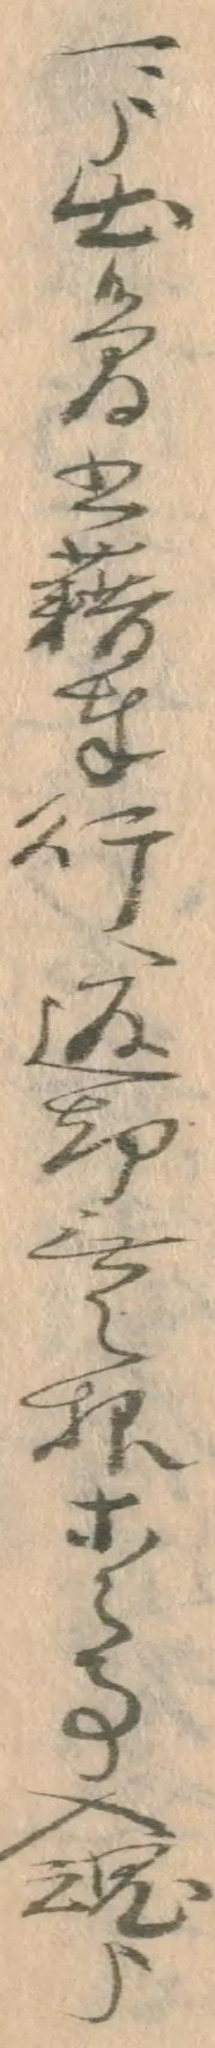可申出候間書籍奉行へ返却無之様等之事入魂申
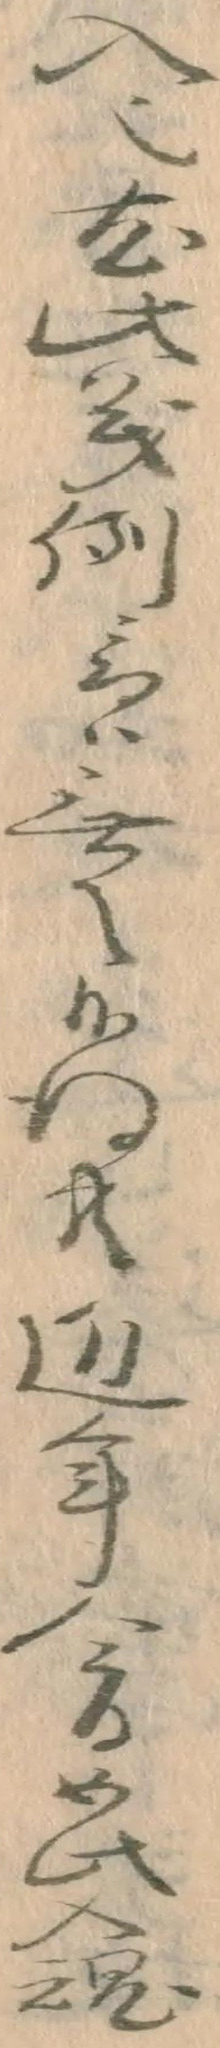入也尤此義例ニ而ハ無之候得共近年今日如此入魂
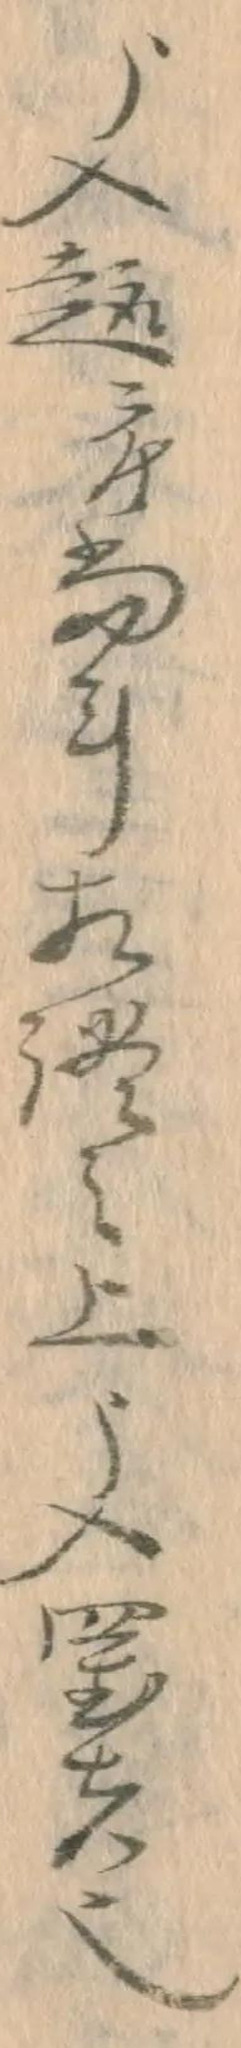申入趣ニ付両斗相談之上申入置者也
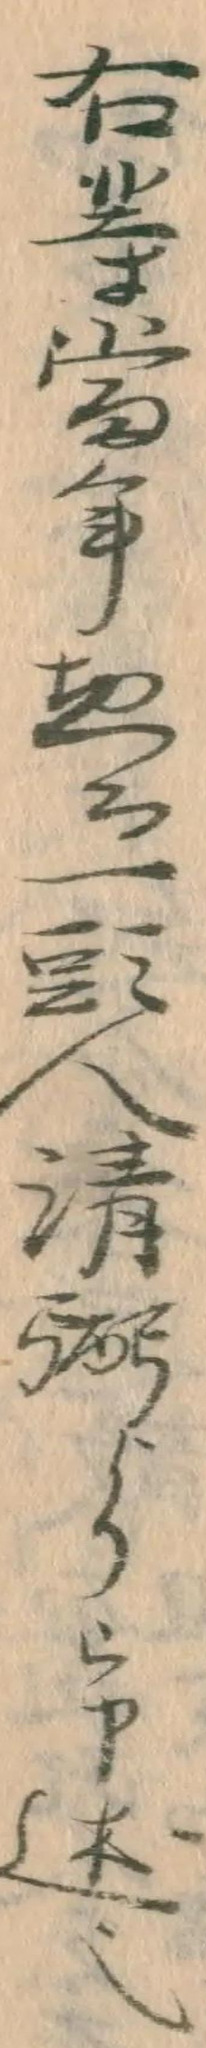右等當年惣而一頭人清弼より被申述也
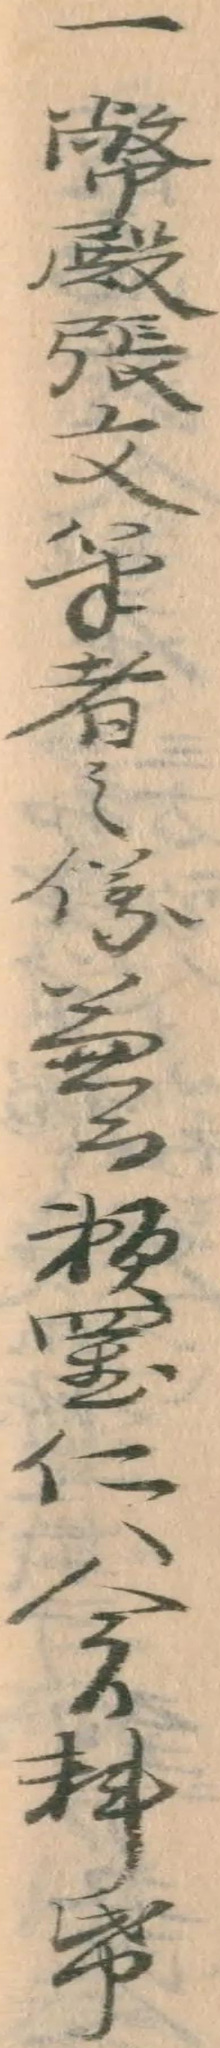一幣殿張文筆者之儀兼而頼置仁へ今日料紙
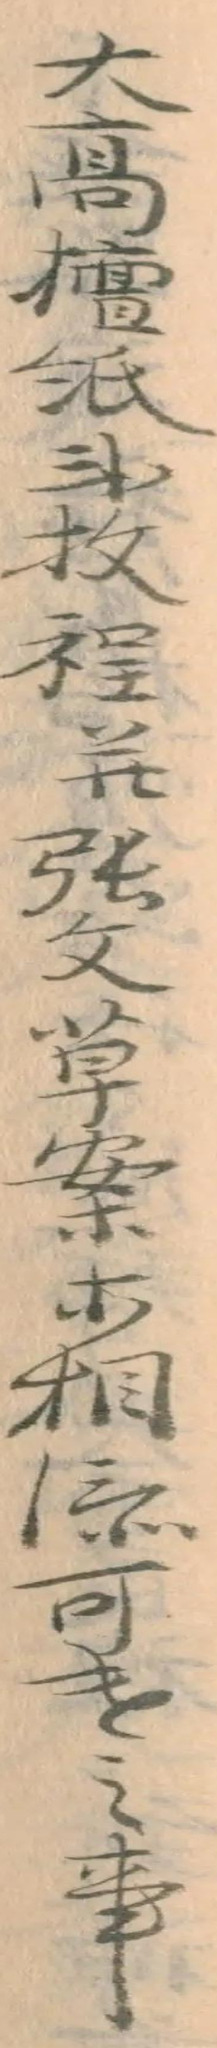大高檀紙弐枚程并張文草案等相添可遣之事
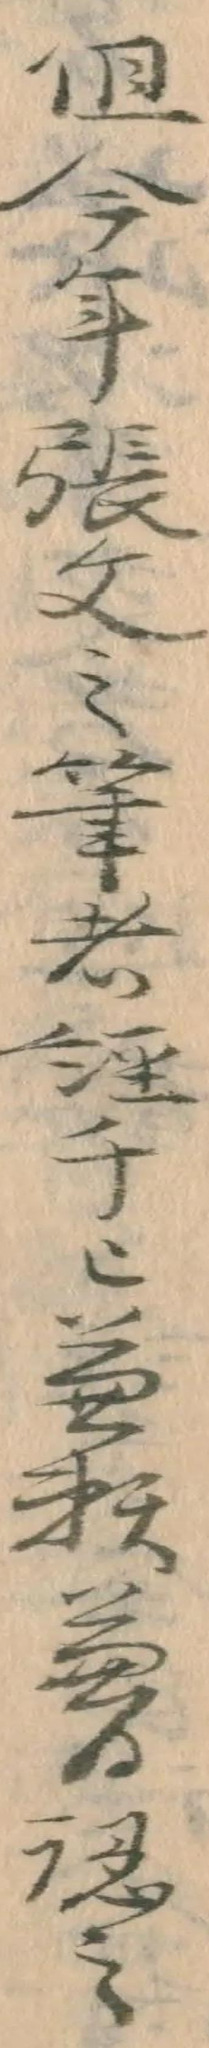但今年張文之筆者経千被兼頼兼而認之
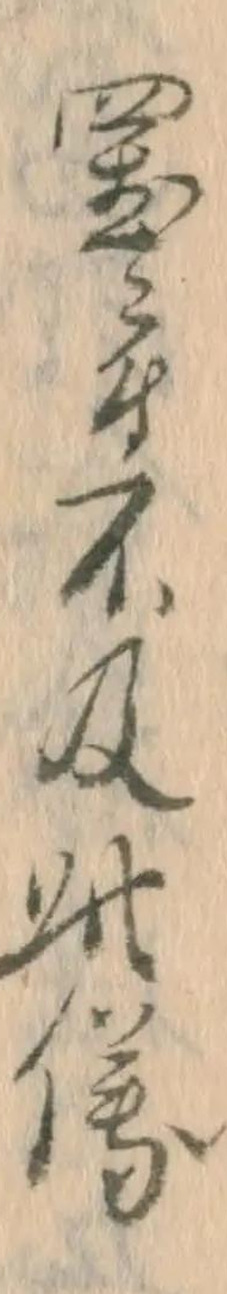置ニ付不及此儀
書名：賀茂社記録. 第72冊
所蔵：国立国会図書館 National Diet Library, JAPAN
